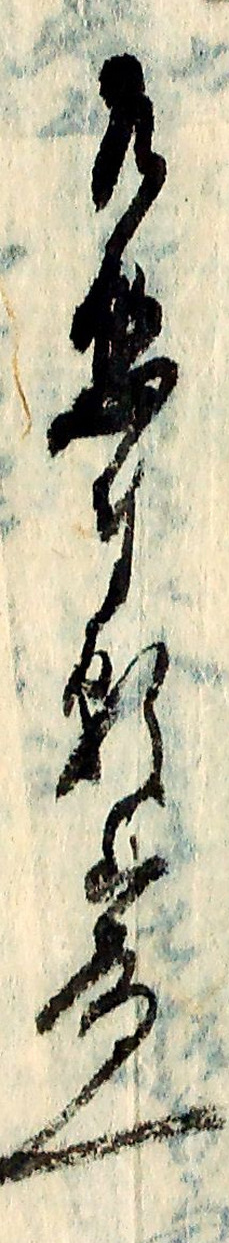乍恐奉願上覚
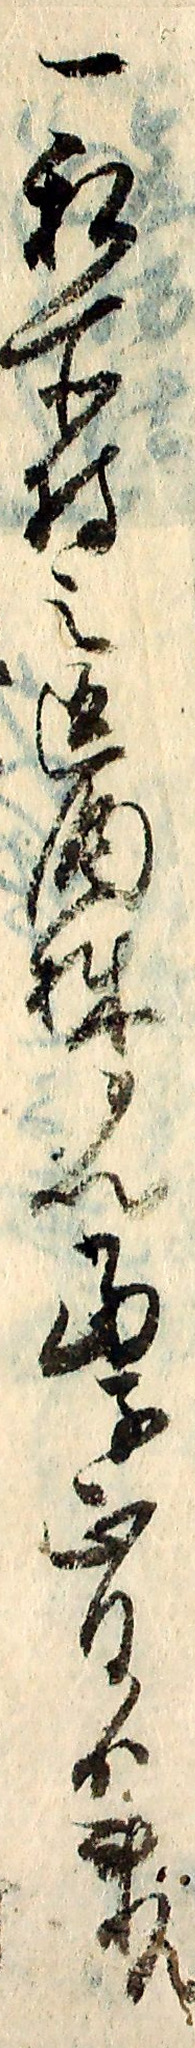一私所持之造酒株を以当子正月ゟ来る
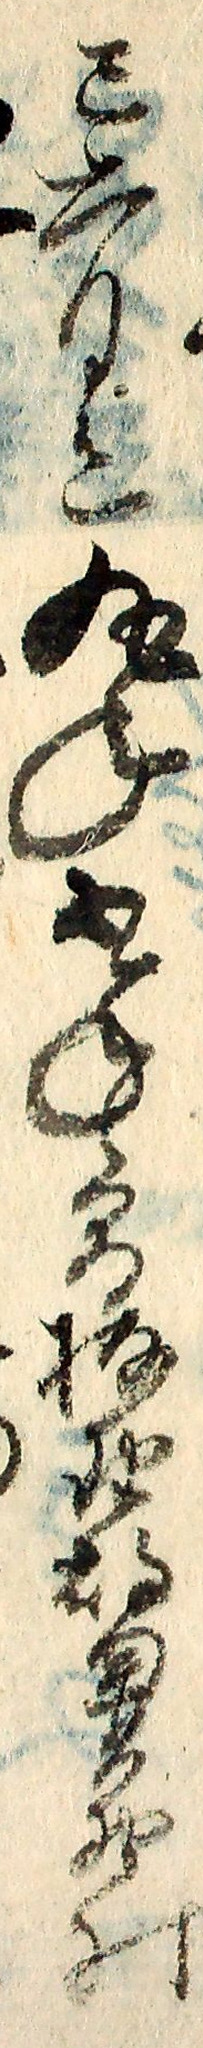巳六月迄丸年五年之間板野郡奥野村
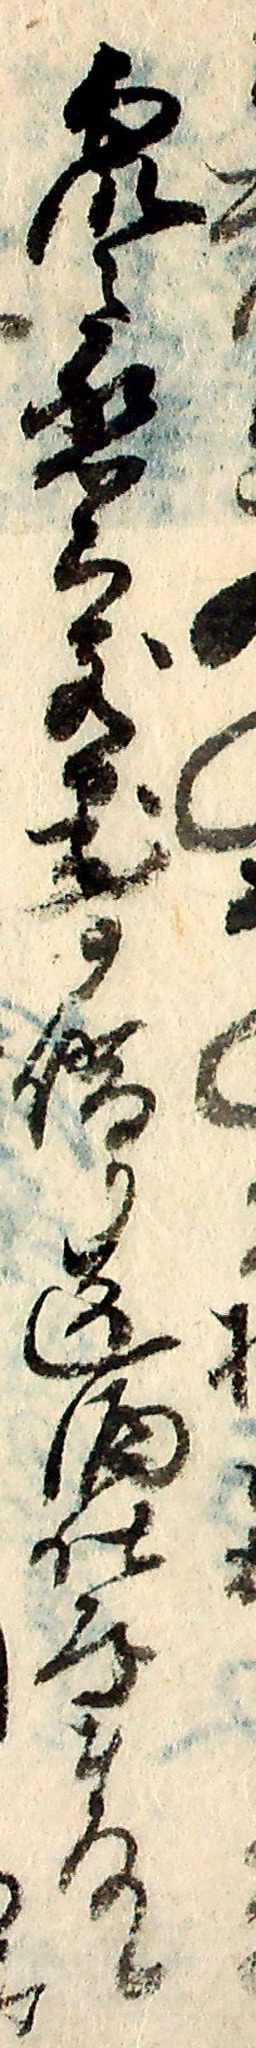虎之丞土蔵宅を借り造酒仕度奉存候
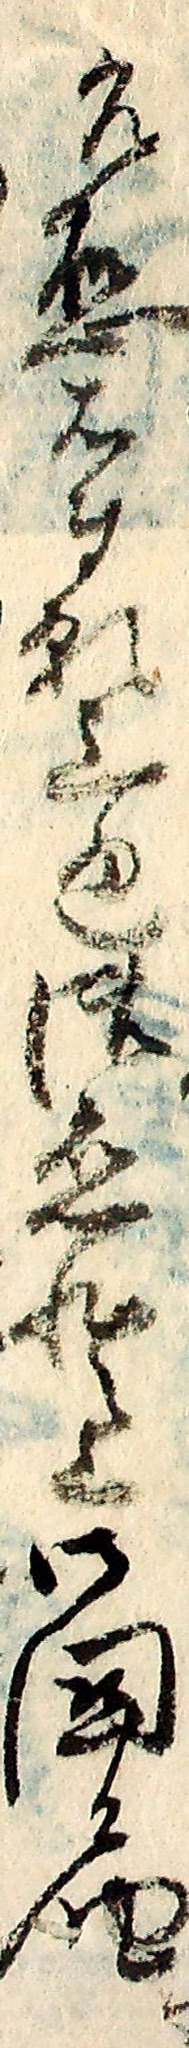乍恐右奉願上通御慈悲之上御聞届け
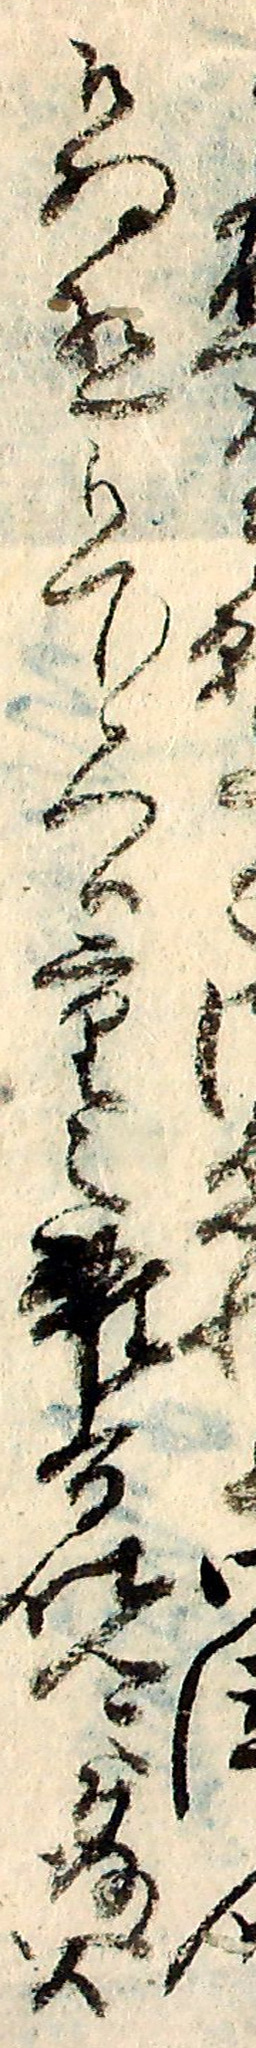被為遊被下候へは重々難有仕合に奉存候以上
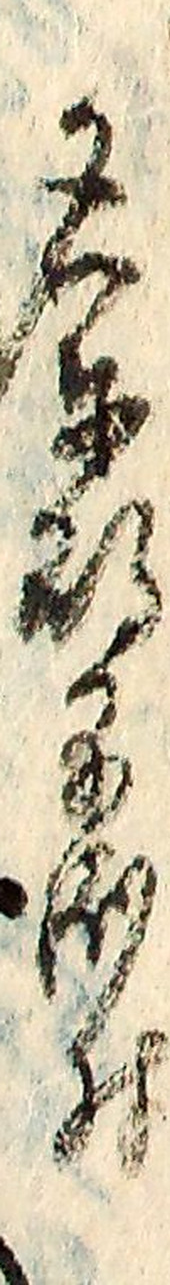名東郡早淵村
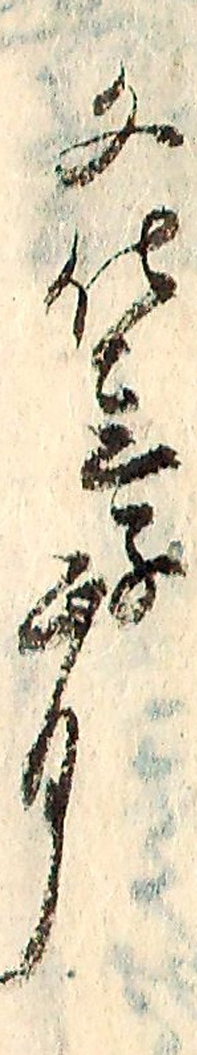文化十三子かの

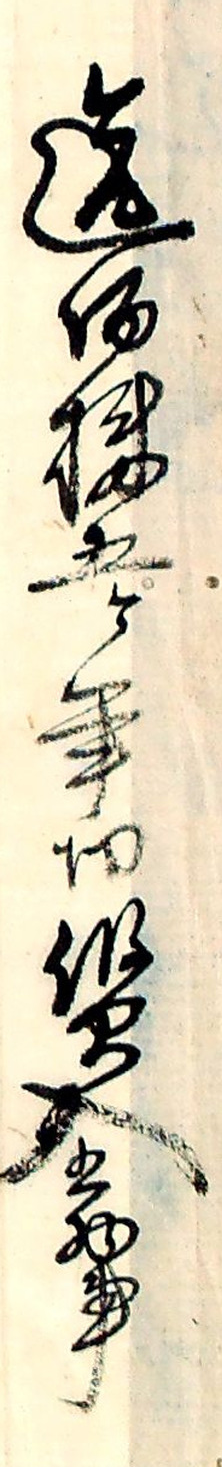造酒株五ヶ年切質入書物事
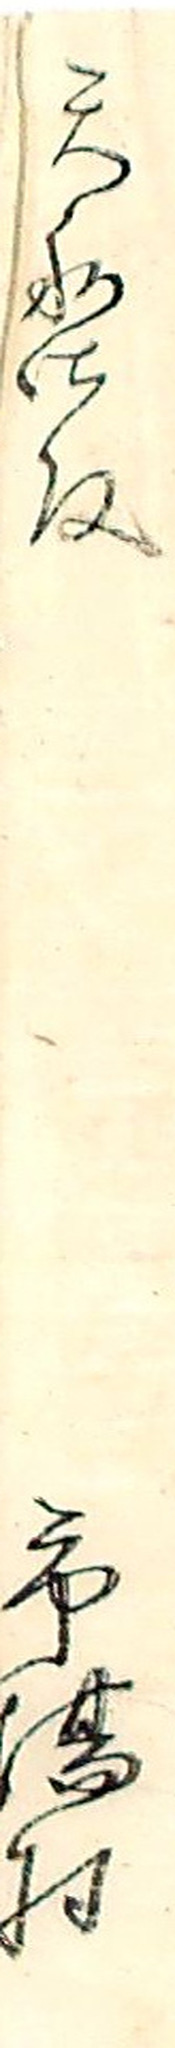天和御改市場村
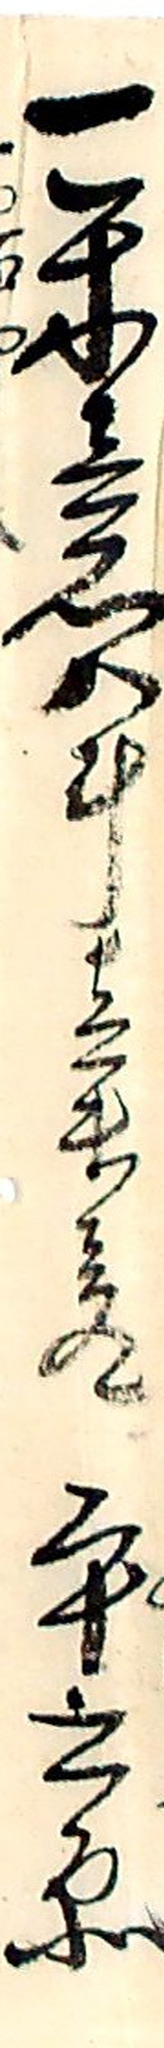一米壱石八斗壱升壱合平六兵衛
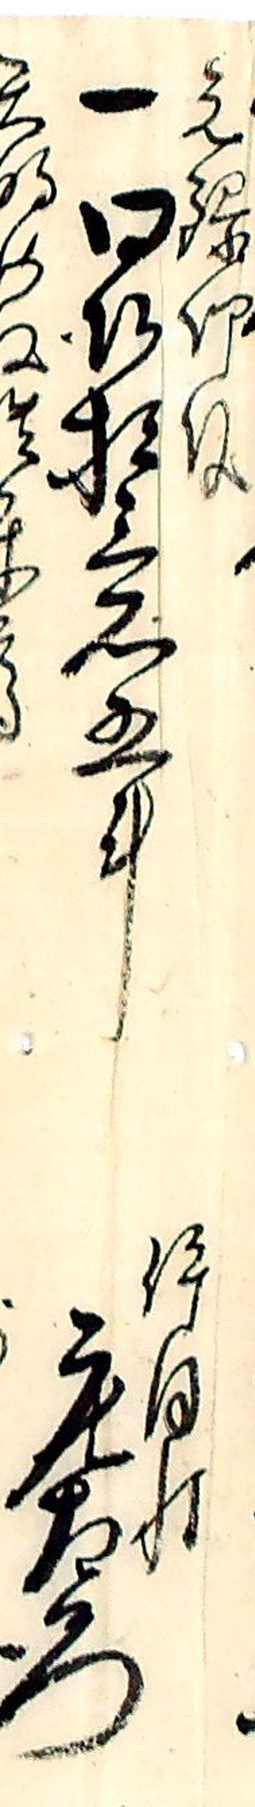一同弐拾三石五斗庄左衛門
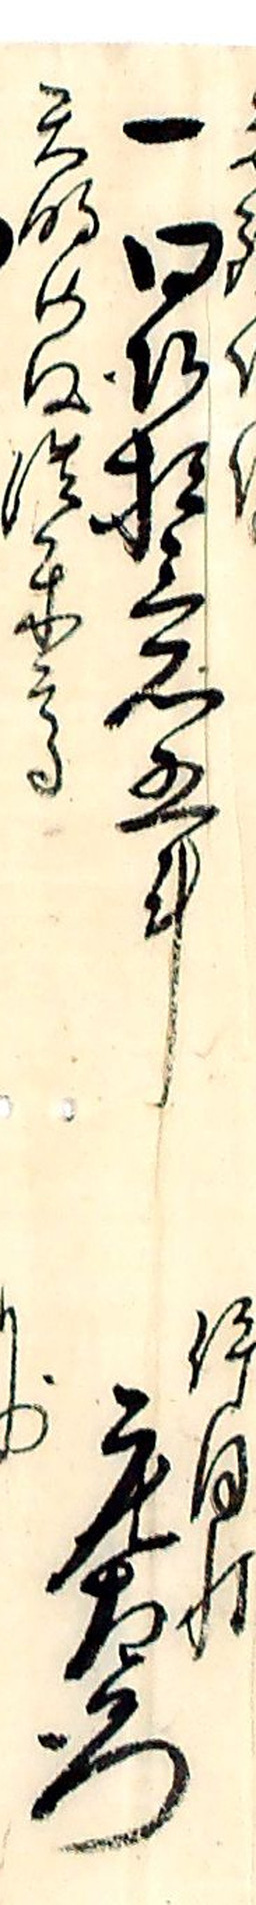一同弐拾三石五斗庄左衛門
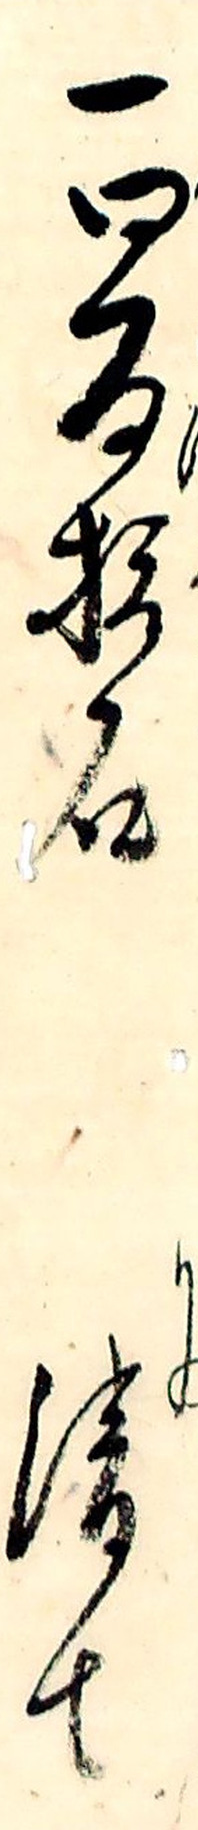一同百拾石清七
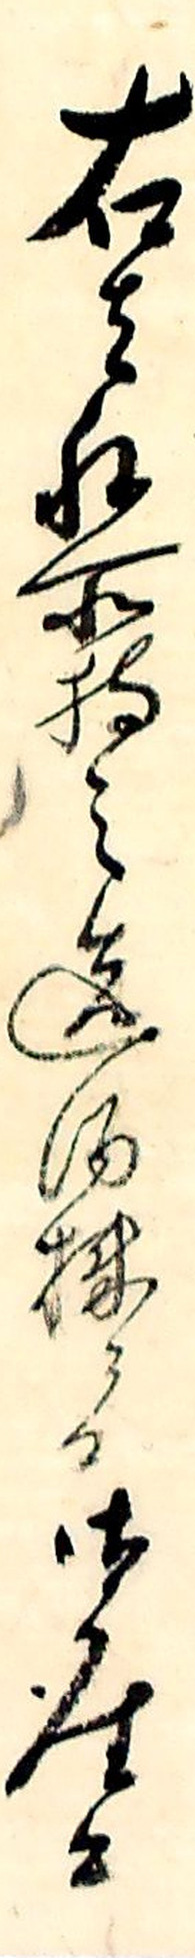右は私所持之造酒株にて御座候
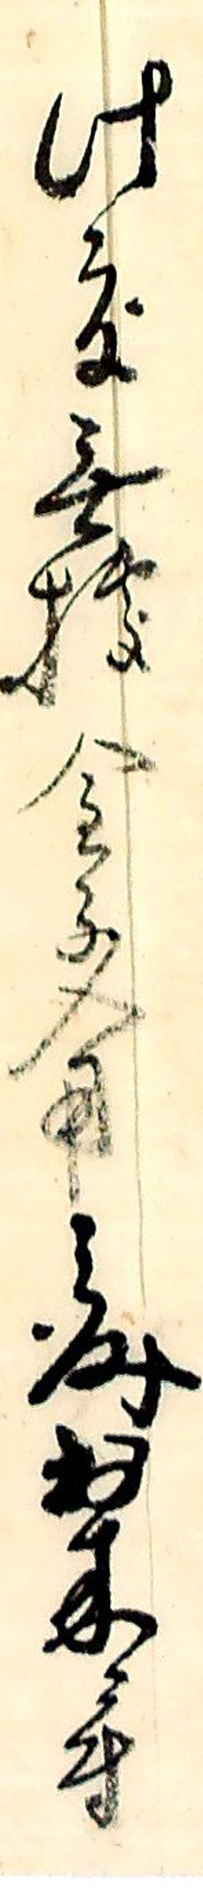此度無拠金子入用之儀出来に付
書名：諸御願書控(後藤氏壱番）
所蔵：鳴門教育大学 Naruto University of Education
